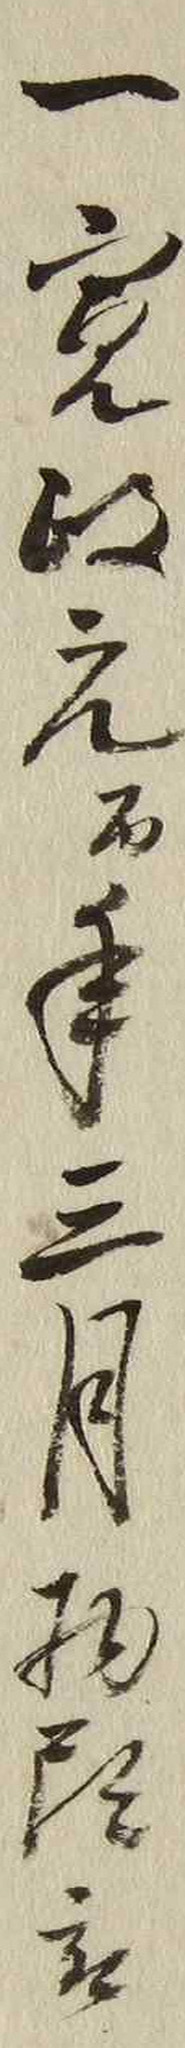一寛政元酉年三月物頭被
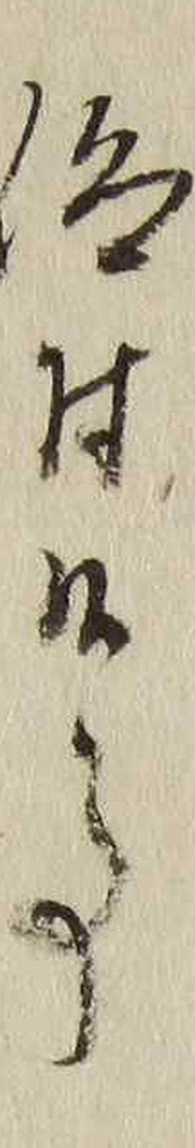仰付候事
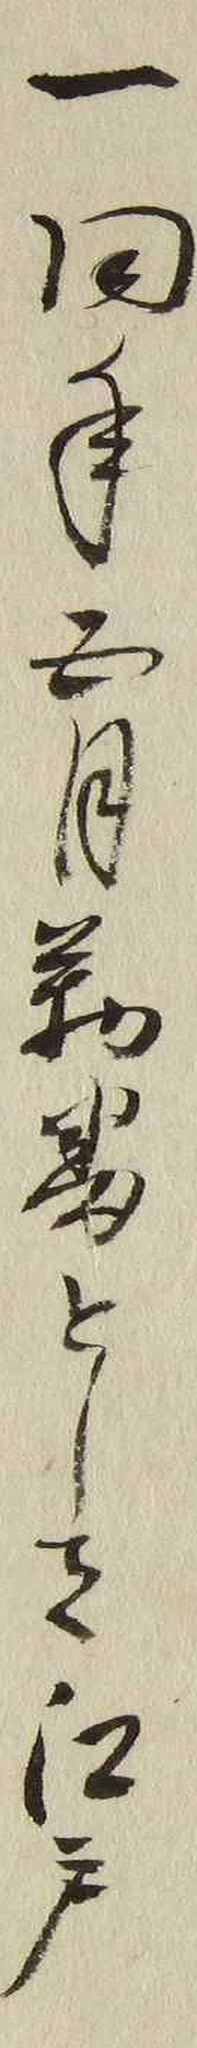一同年五月勤番として江戸
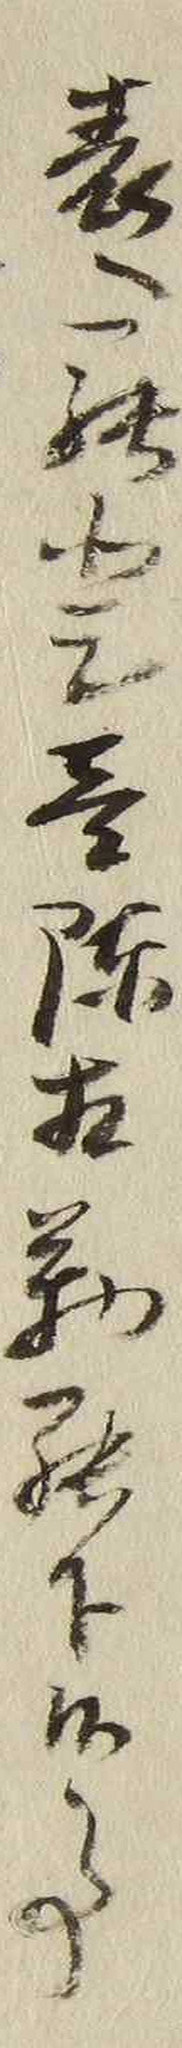表へ罷登壱陣相勤罷下候事
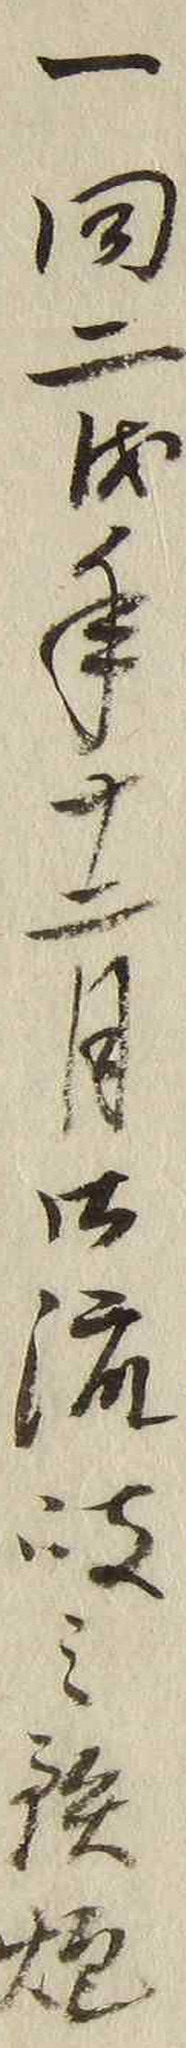一同二戌年十二月御流岐之鉄炮
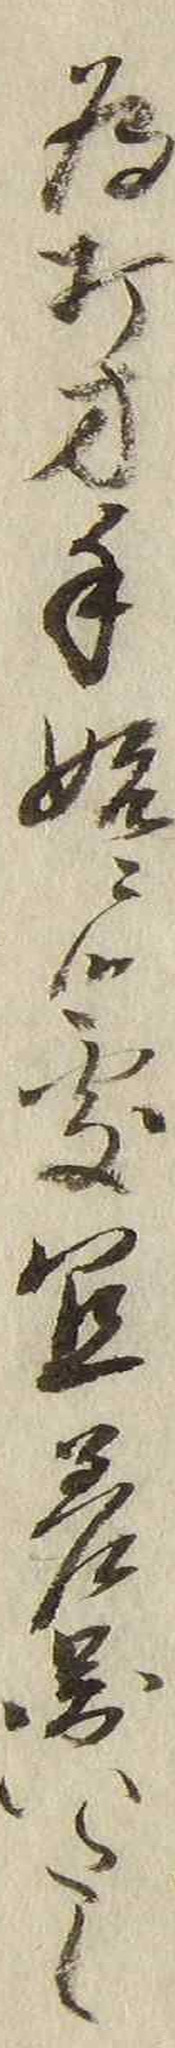為打方手始ニ候処宜差図いたし

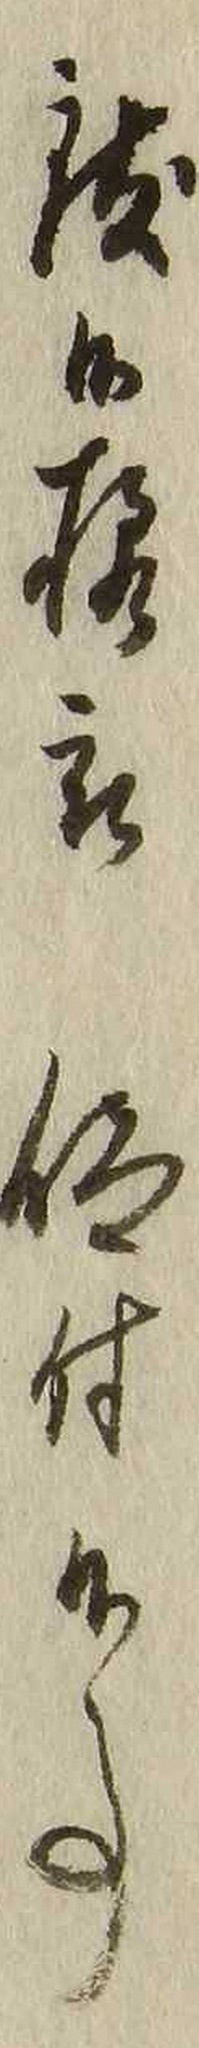致候様被仰付候事
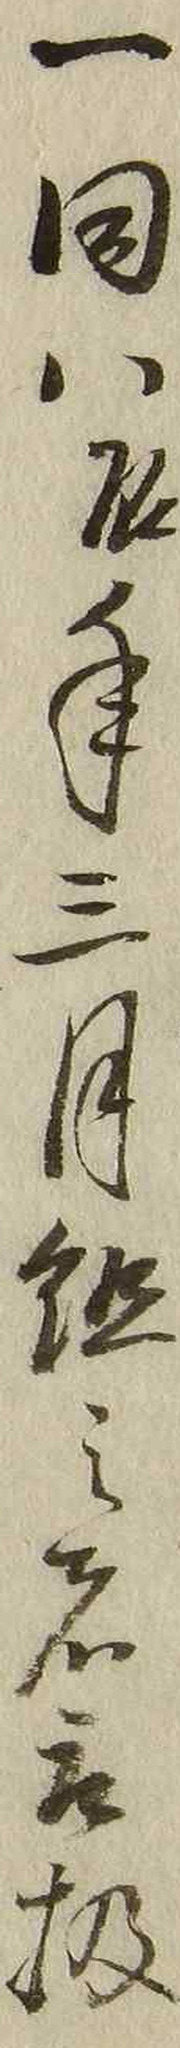一同八辰年三月組之者取扱
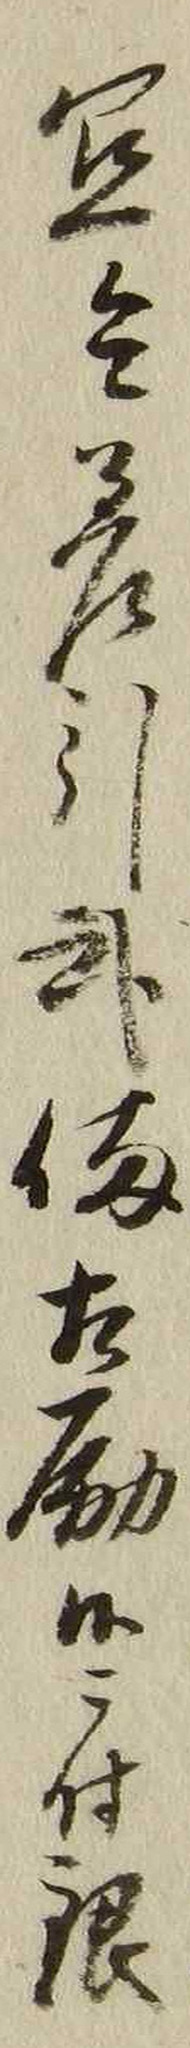宜兵差引武備相励候ニ付銀
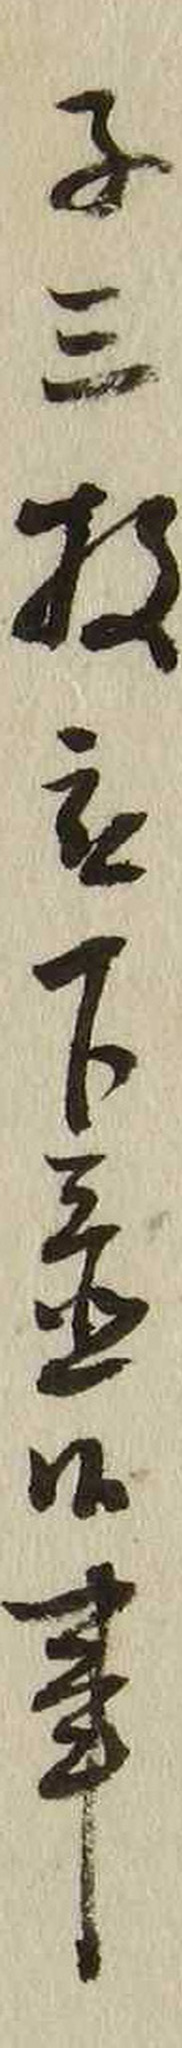子三枚被下置候事
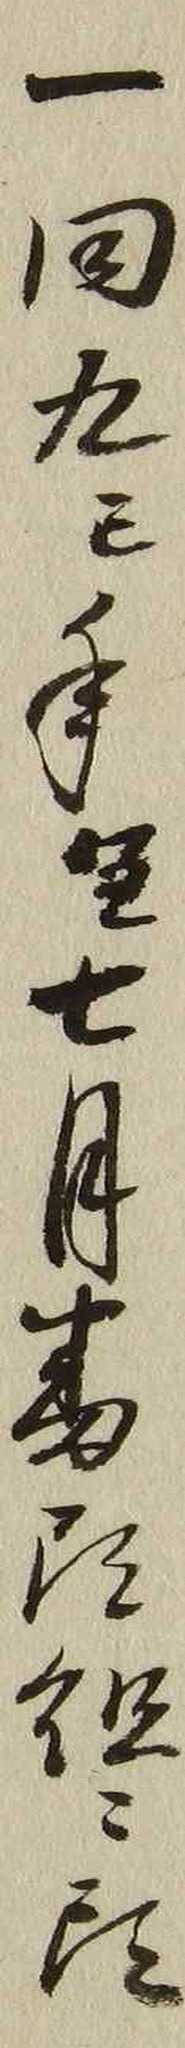一同九巳年閏七月番頭組々頭
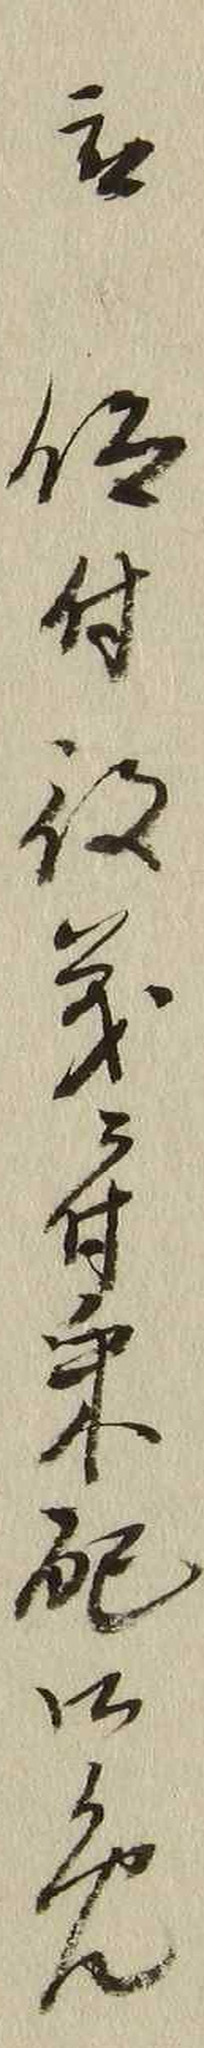被仰付役義ニ付采配御免
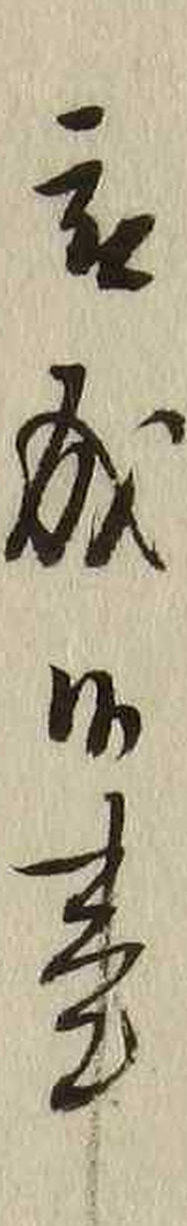被成候事
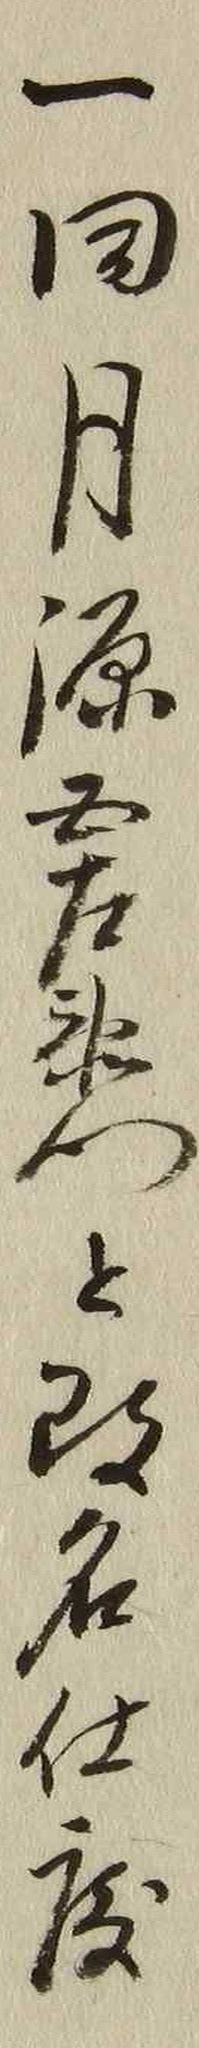一同月源五左衛門と改名仕度
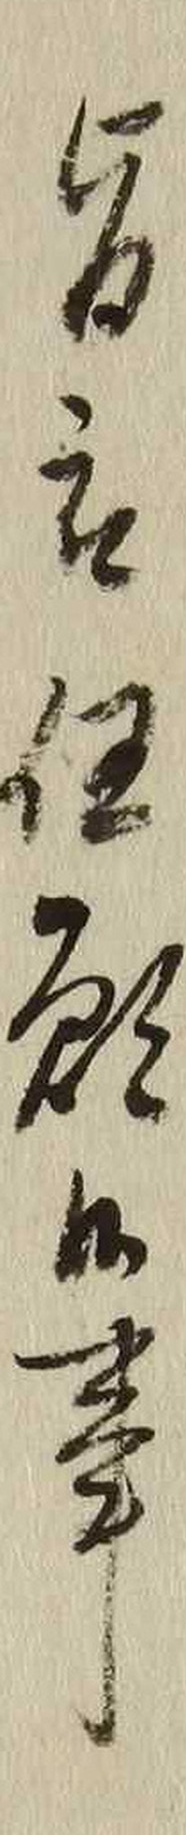旨被任願候事
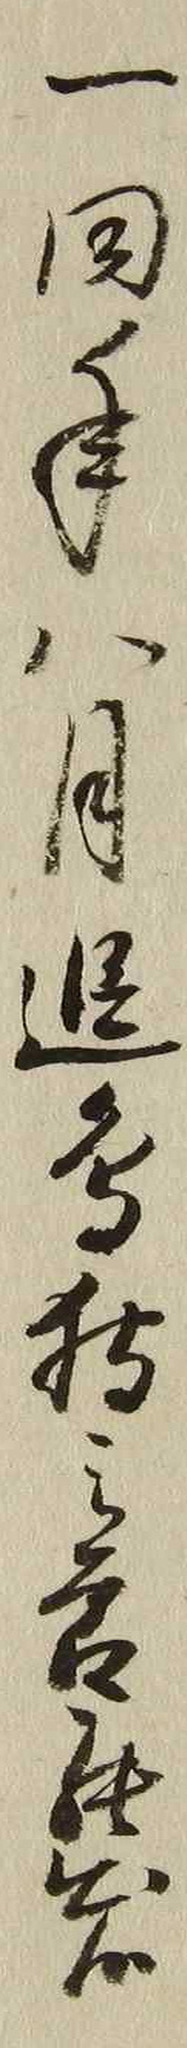一同年八月追鳥狩之節罷出候
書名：諸士系譜　巻之355　す之部5
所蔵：会津若松市立会津図書館
